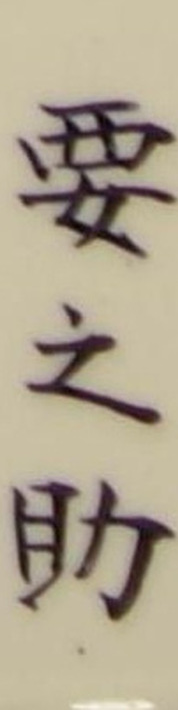要之助
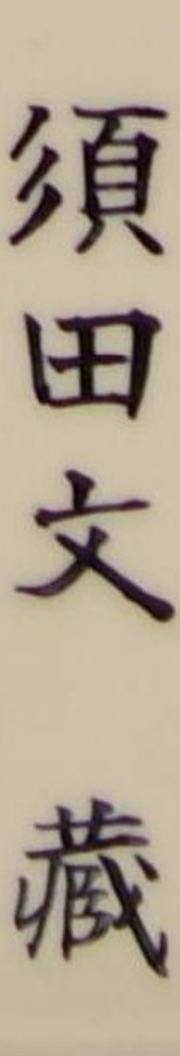須田文蔵
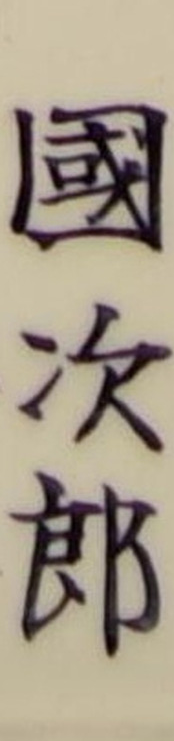國次郎
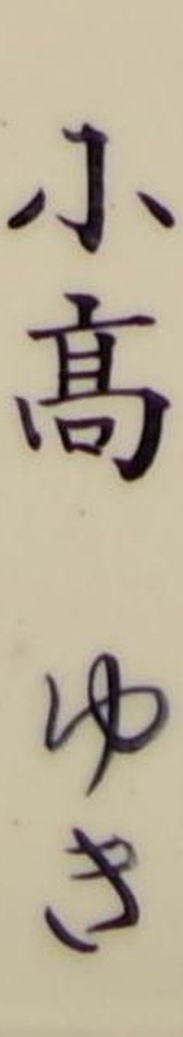小高ゆき
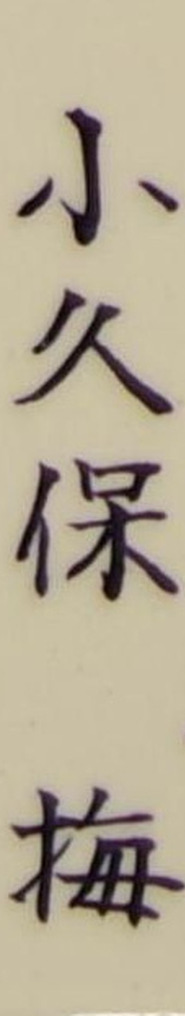小久保梅

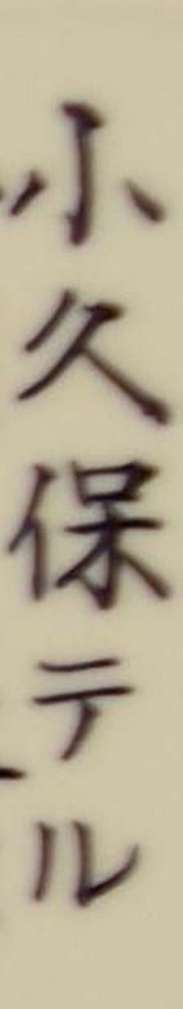小久保テル
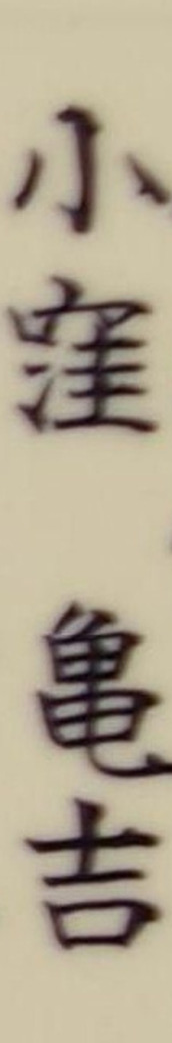小窪亀吉
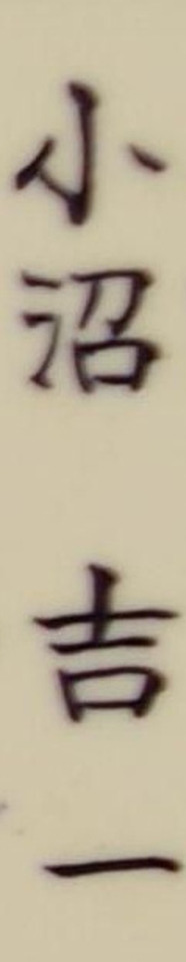小沼吉一
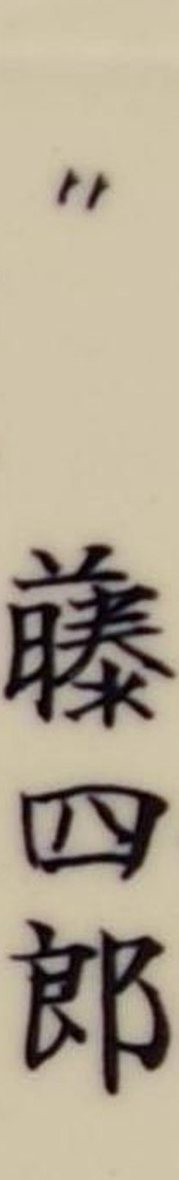藤四郎
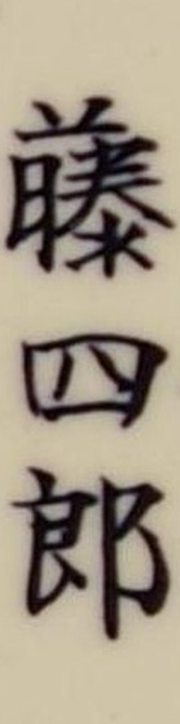藤四郎
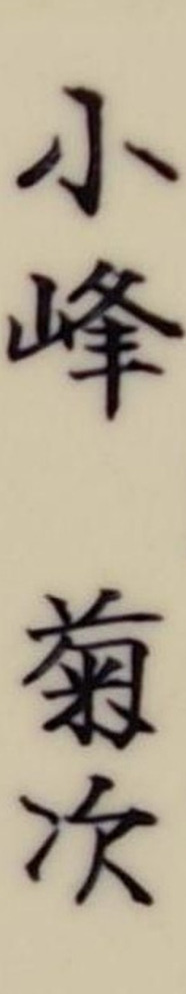小峰菊次
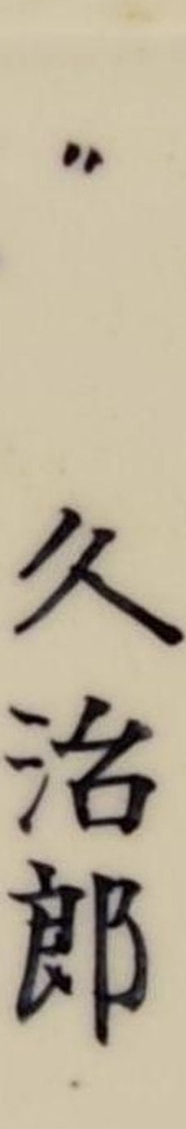久治郎
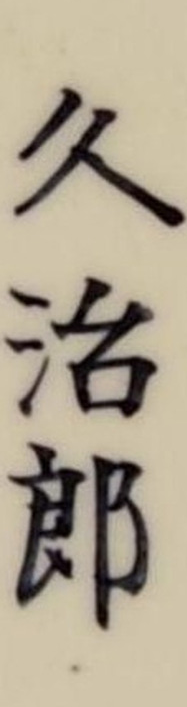久治郎
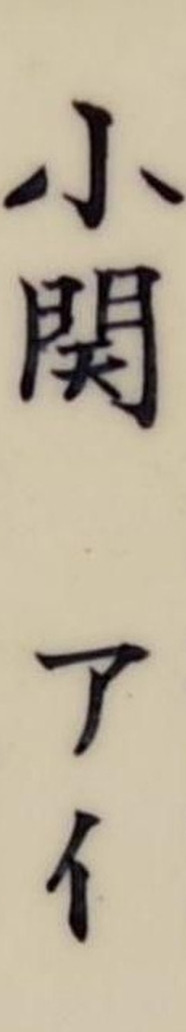小関アイ
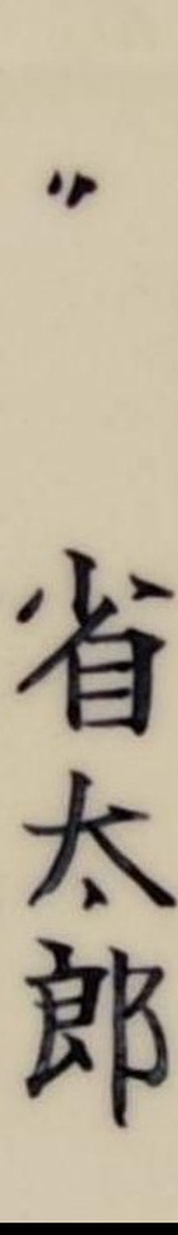省太郎
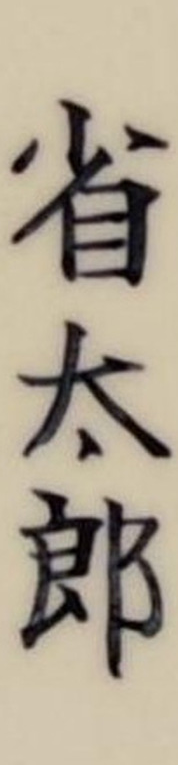省太郎
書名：E~L
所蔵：高野山金剛峯寺
